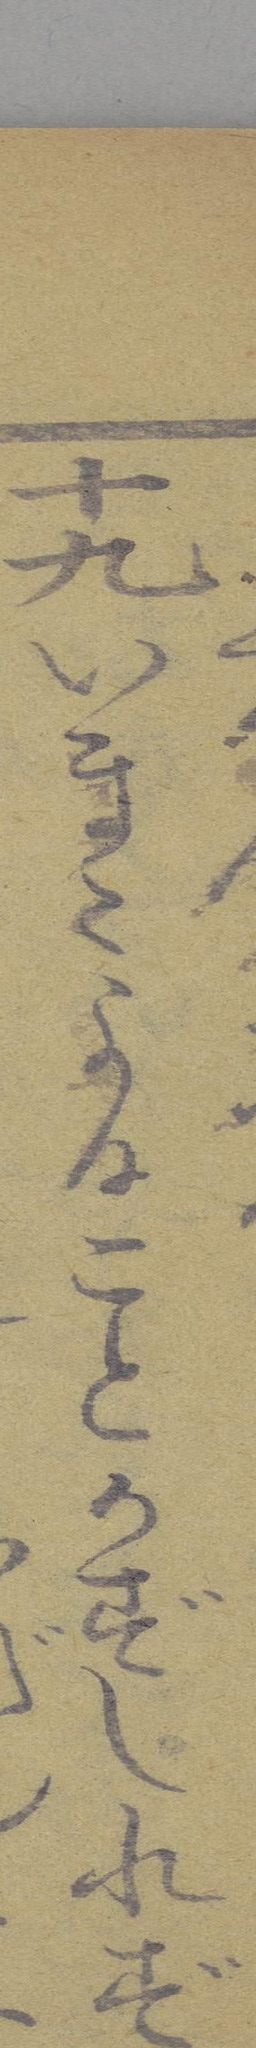十九いまこよることかずしれず
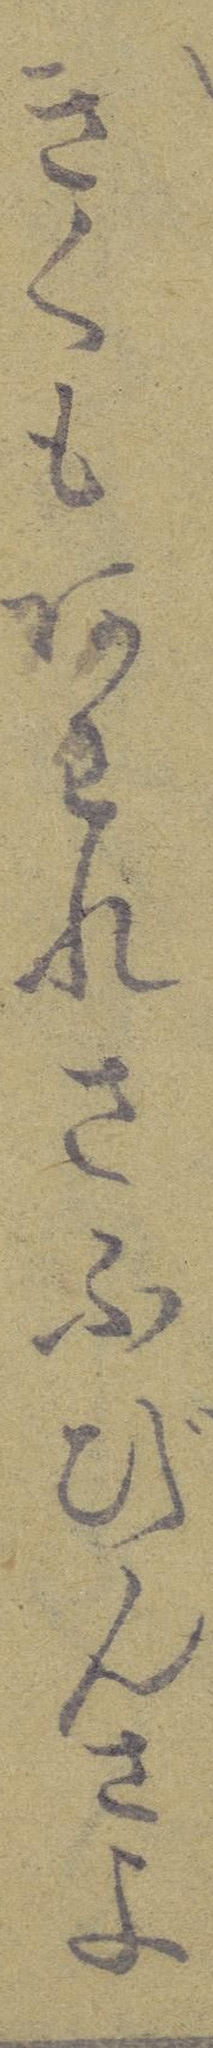きくもあわれさふびんさよ
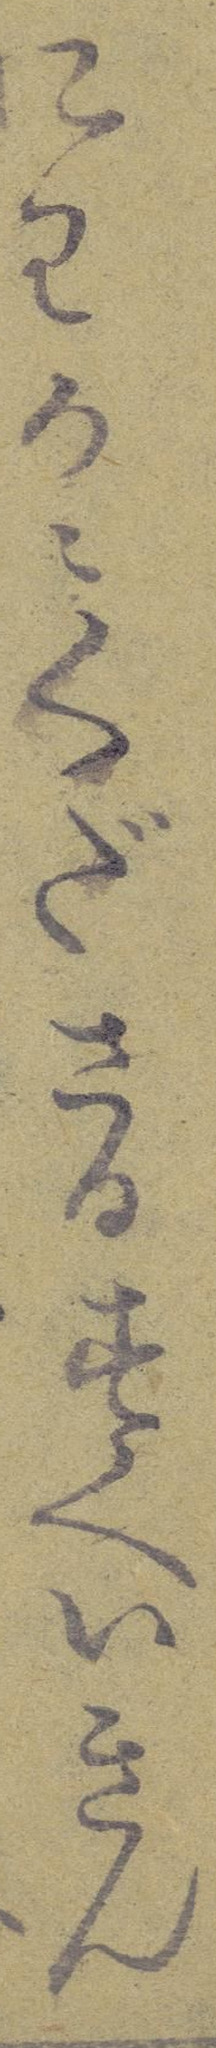にわかにくださるすくいきん
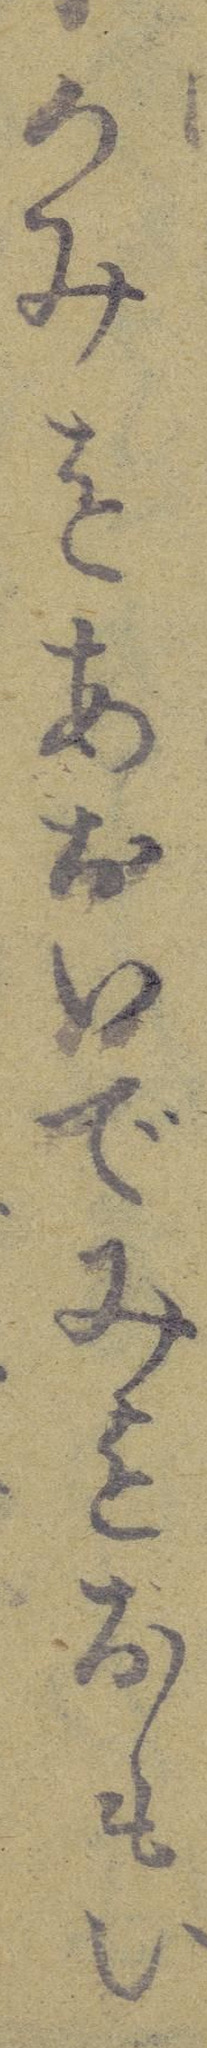二十かみをあおいでみをおもい
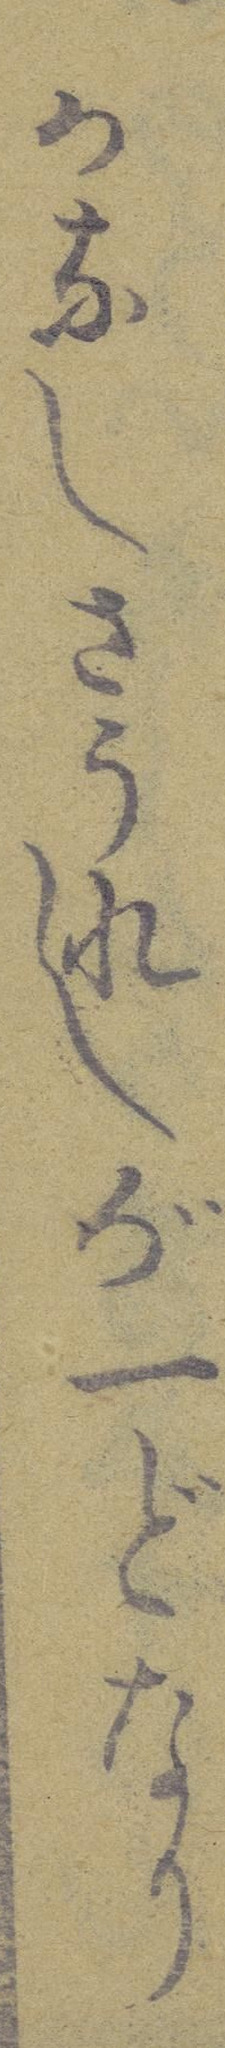かなしさうれしが一どなり
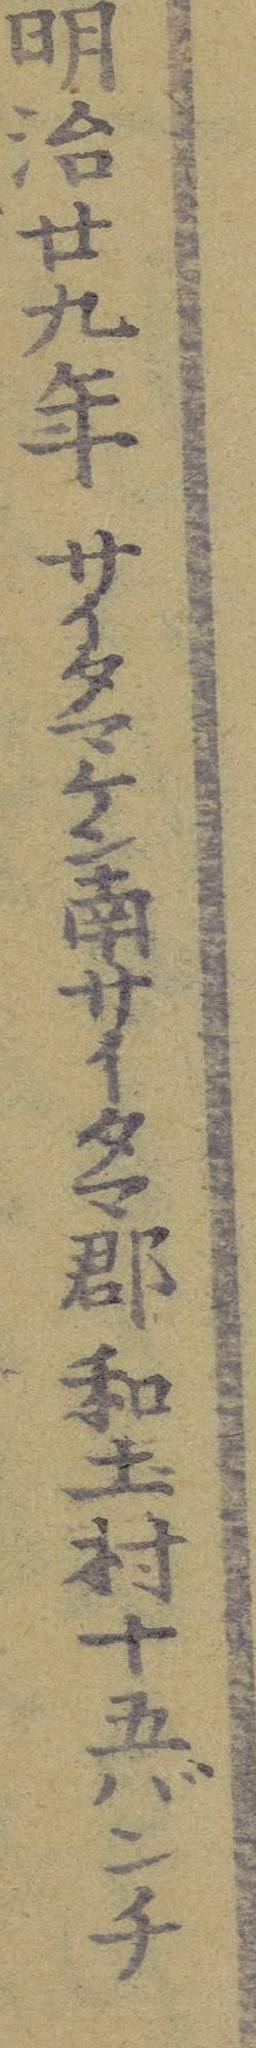明治廿九年サイタマケン南サイタマ郡和土村十五バンチ
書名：岩手ケン宮城青森海嘯しんぶん
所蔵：東京大学地震研究所図書室 Earthquake Research Institute Library, The University of Tokyo, JAPAN
